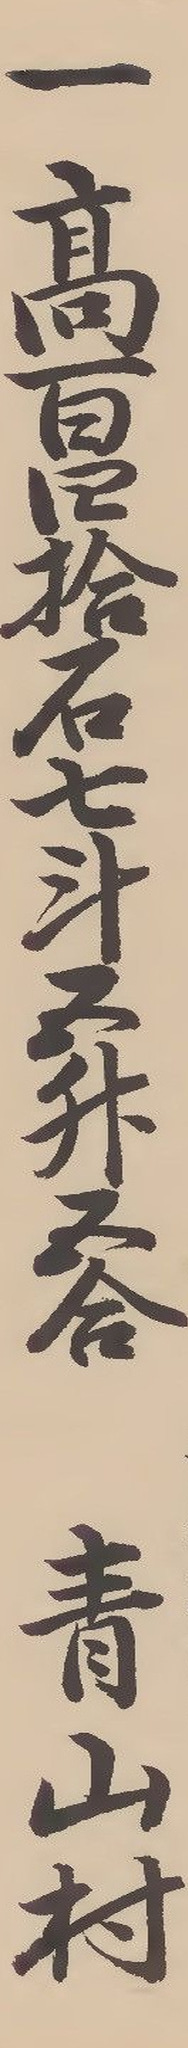一高百四拾石七斗五升五合青山村

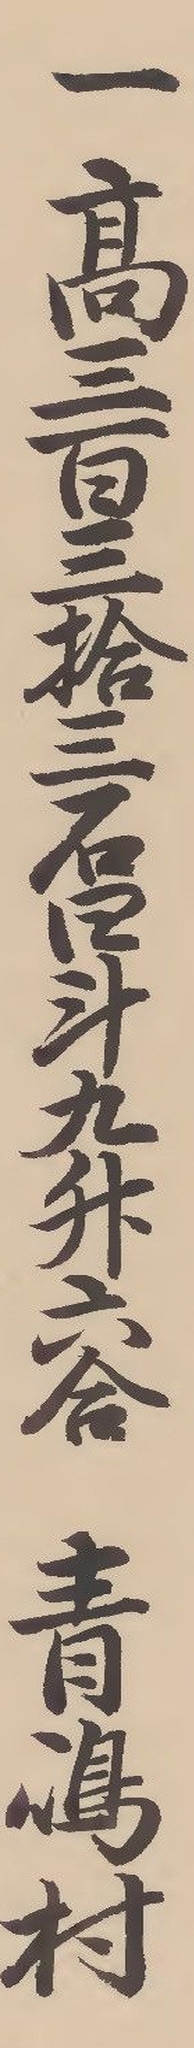一高三百三拾三石四斗九升六合青島村
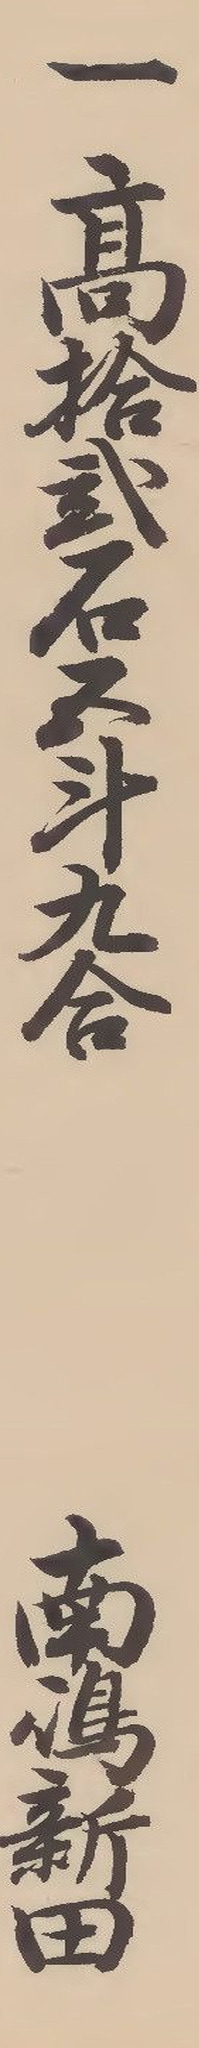一高拾弐石五斗九合南島新田
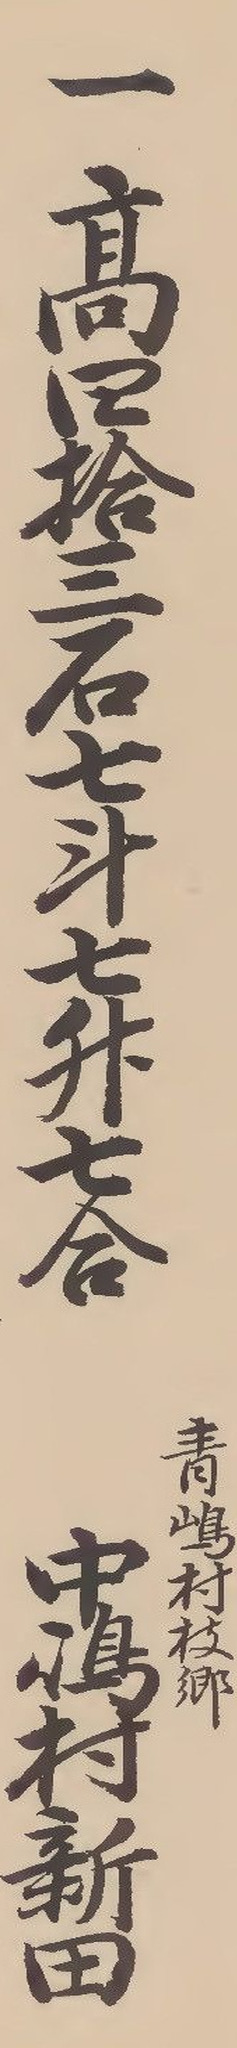一高四拾三石七斗七升七合中島村新田
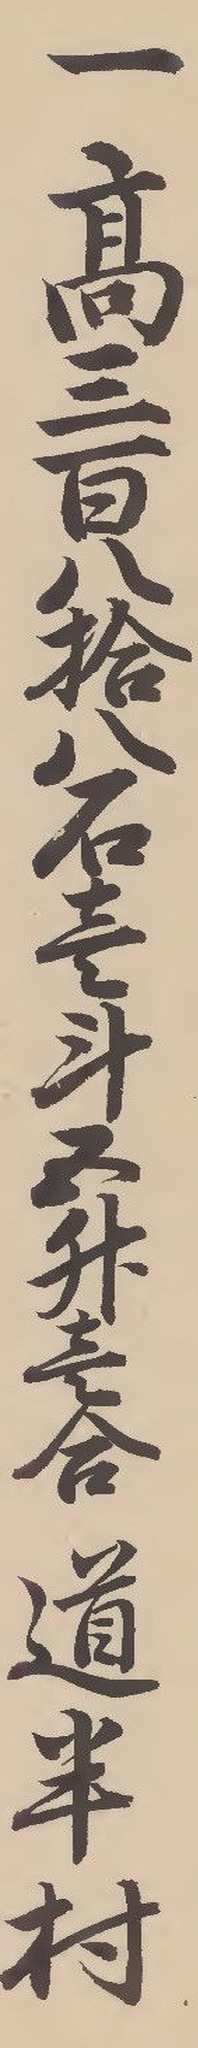一高三百八拾八石壱斗五升壱合道半村
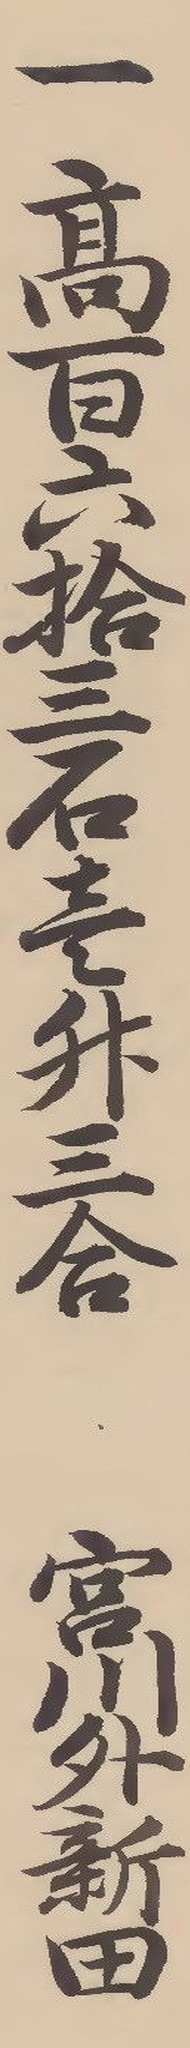一高百六拾三石壱升三合宮川外新田
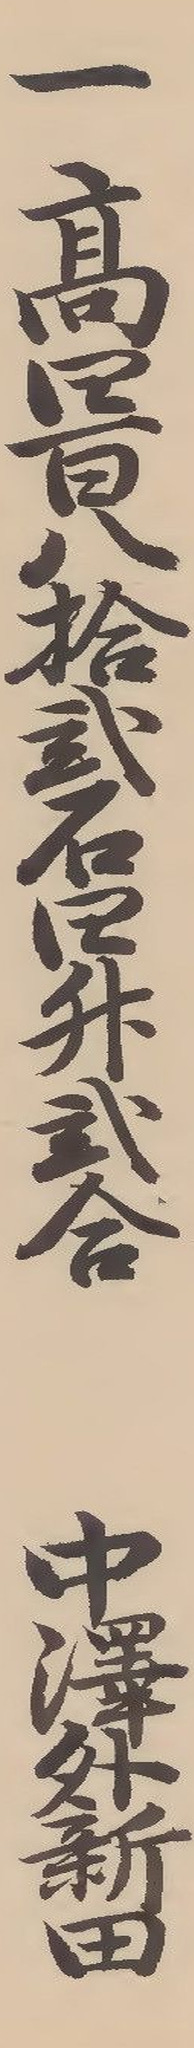一高四百八拾弐石四升弐合中沢外新田
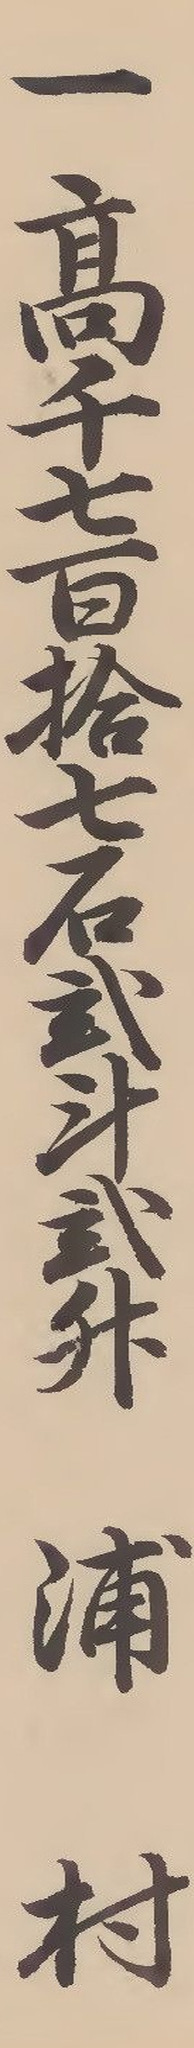一高千七百拾七石弐斗弐升浦村
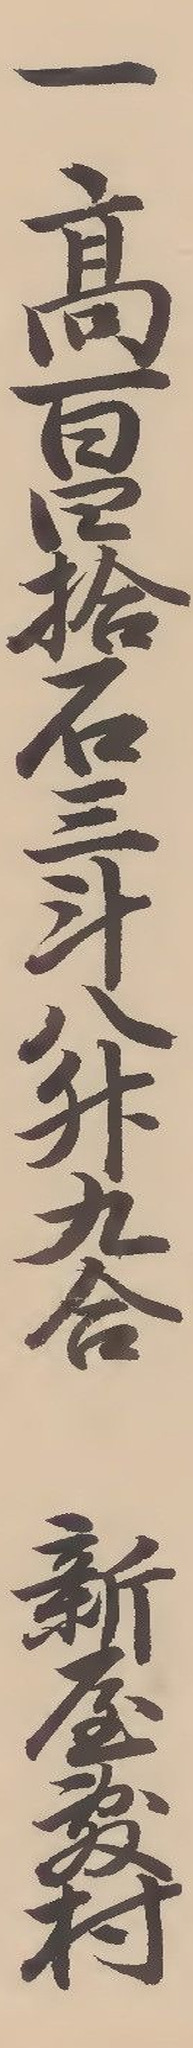一高百四拾石三斗八升九合新屋敷村

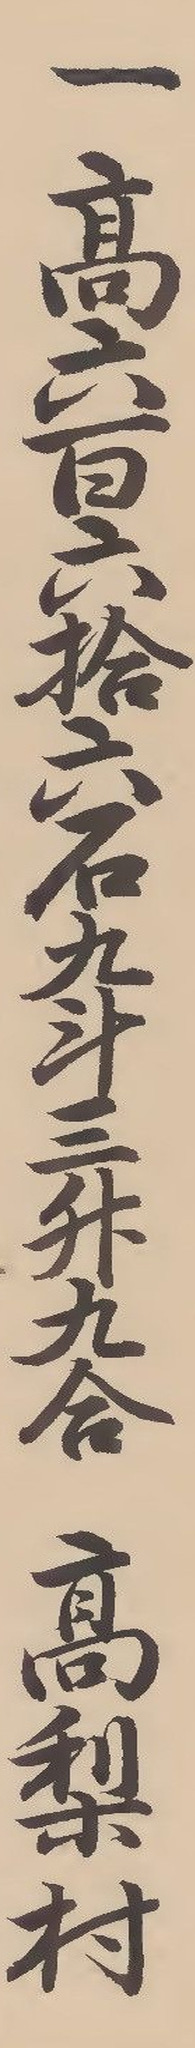一高六百六拾六石九斗三升九合高梨村
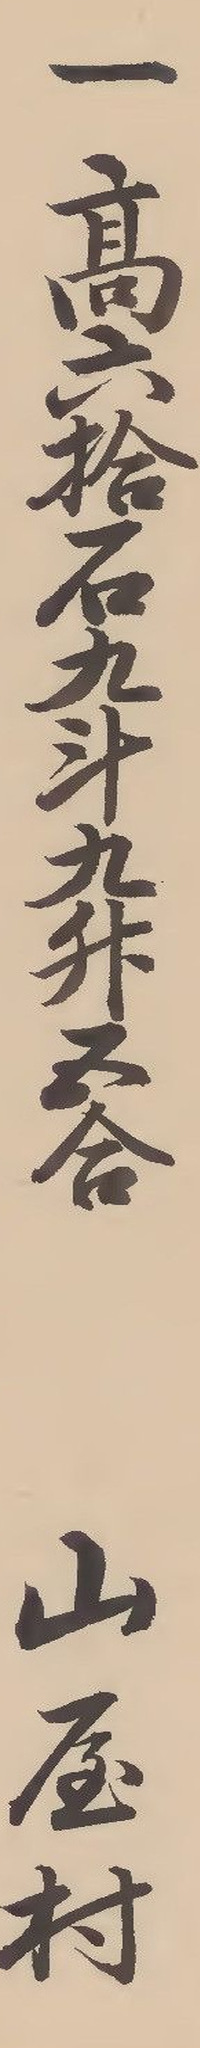一高六拾石九斗九升五合山屋村
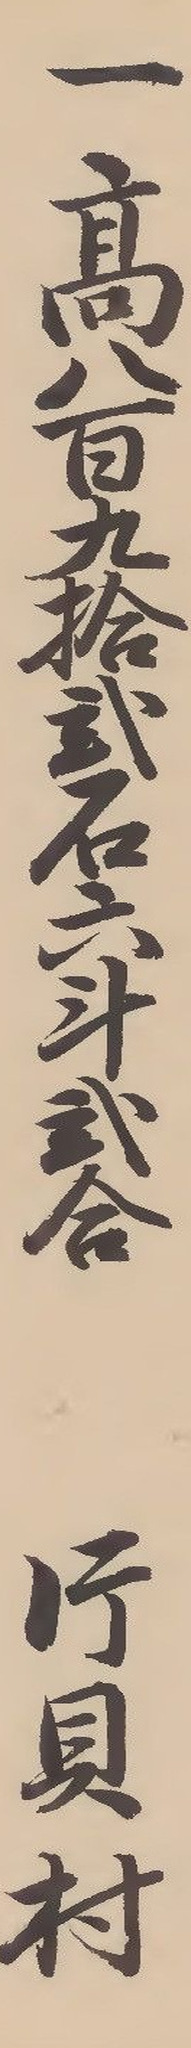一高八百九拾弐石六斗弐合片貝村
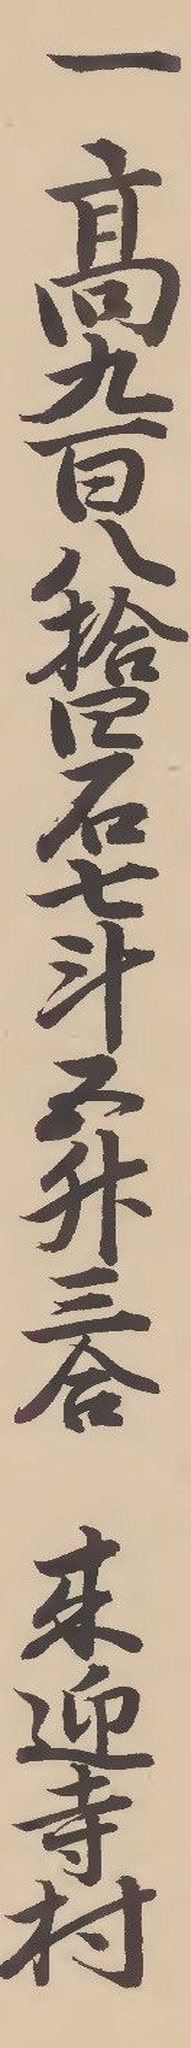一高九百八拾四石七斗五升三合来迎寺村
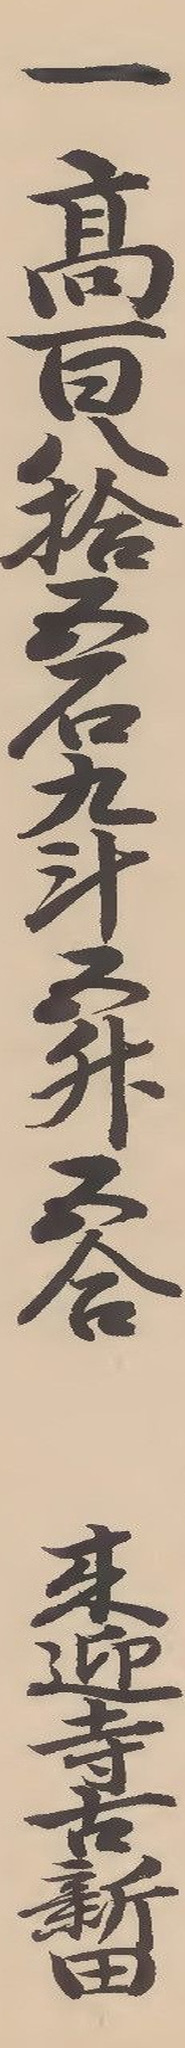一高百八拾五石九斗五升五合来迎寺古新田
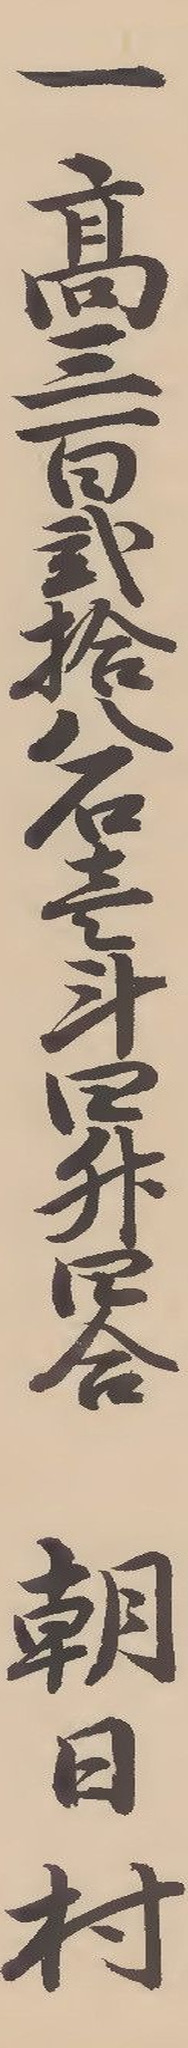一高三百弐拾八石壱斗四升四合朝日村
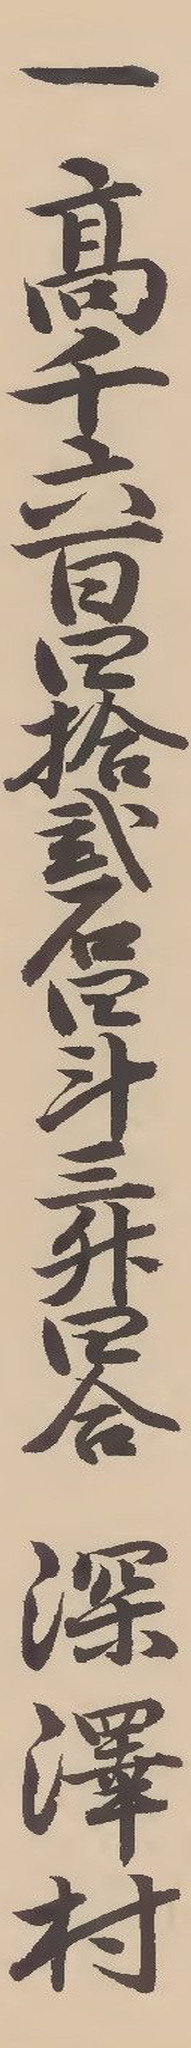一高千六百四拾弐石四斗三升四合深沢村
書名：越後国郷帳　中
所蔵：国立公文書館 National Archives of Japan
